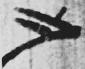之
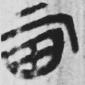○（宛）
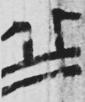丘
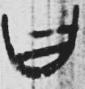曰
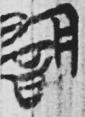韵（洵）
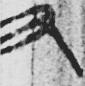又（有）
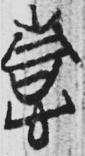情
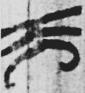而
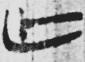亡（無）
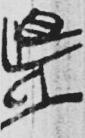望
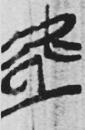○（吾）
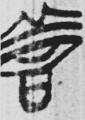善
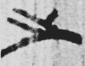之
